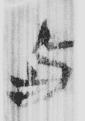此
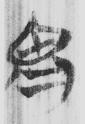胃
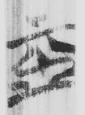亞
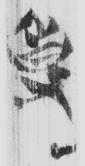事
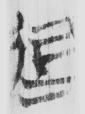起
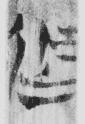{辶殳}
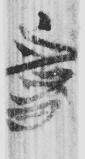時
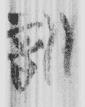訓
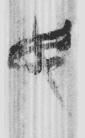民
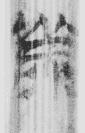備
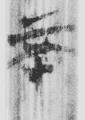不
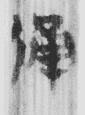俑
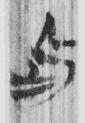此
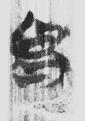胃
